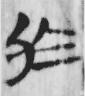於
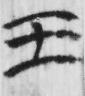王
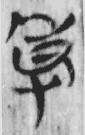事
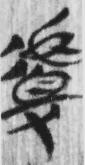且
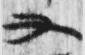又（有）
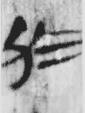於
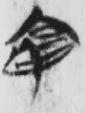竆（躬）
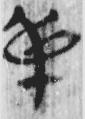身
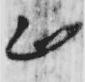㠯（以）
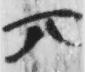亓（其）
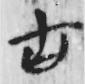古（故）
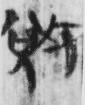敓
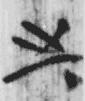之
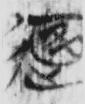迻
